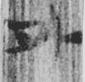外
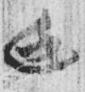臣
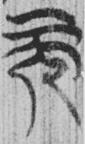而
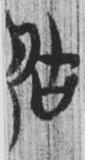居
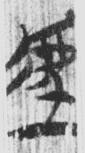○（吾）
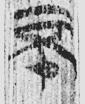不
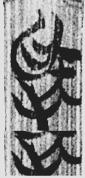爯（稱）
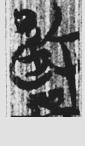○（賢）
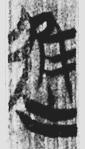進
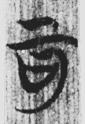可
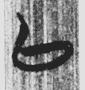㠯（以）
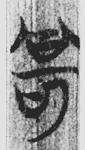○（屏）
